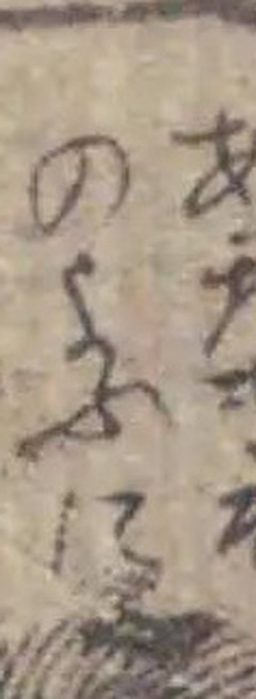のよふに
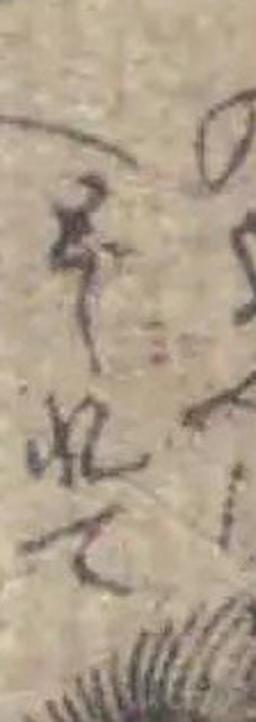としれて
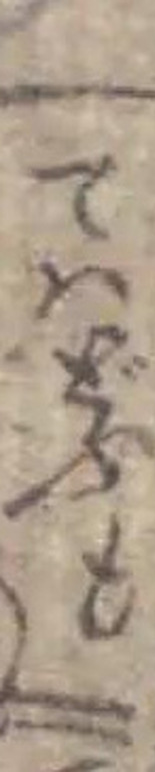てはどふも

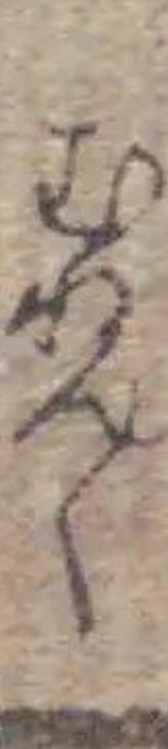むねん〳〵
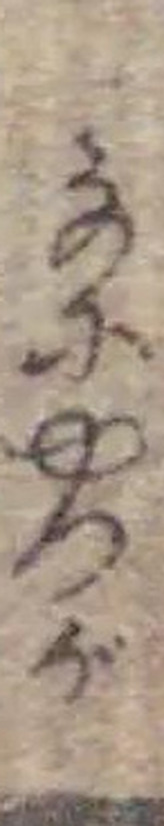なにやつが
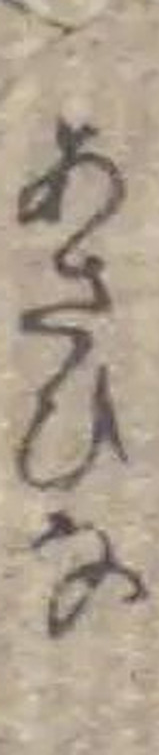あさひな
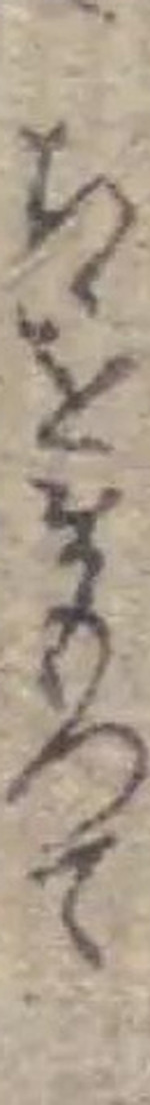ちゝをまつて
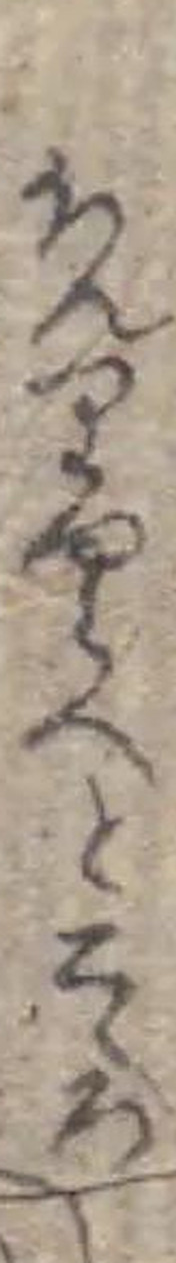はんりやうへとこゝろ
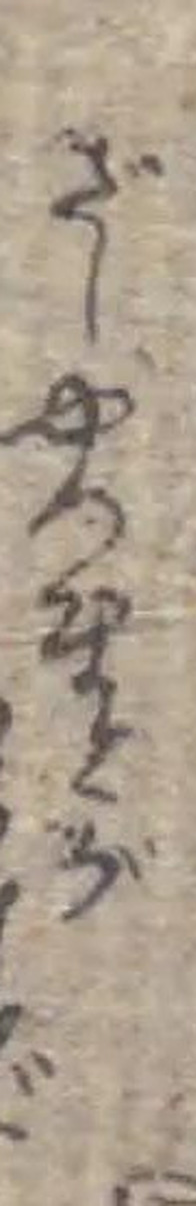ざしやつまとが
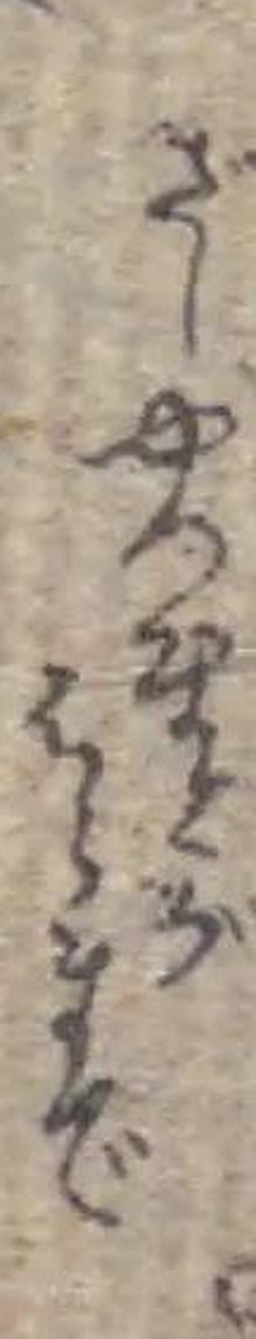はらまで
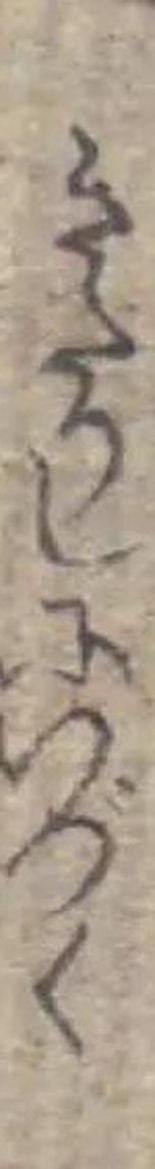きたりしにいづく
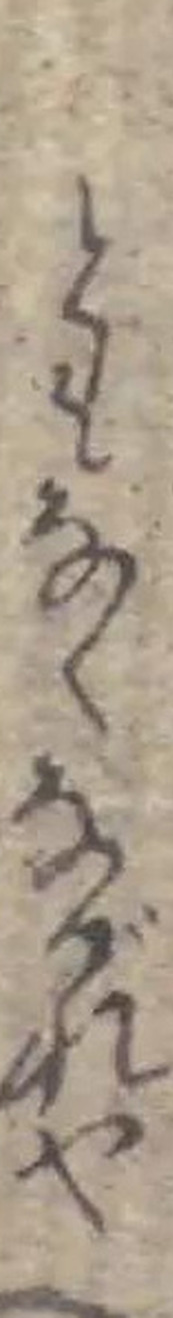ともなくながれや
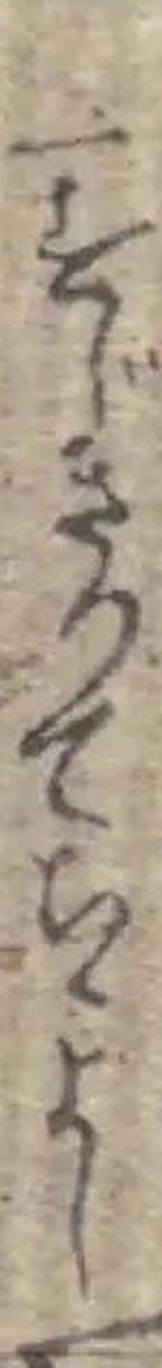一すじきつ？てちゝよし
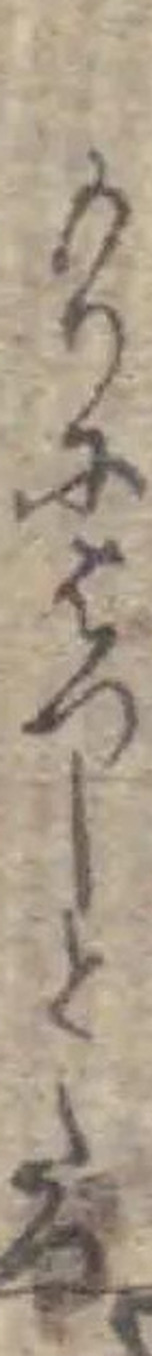もりにはつしとたる
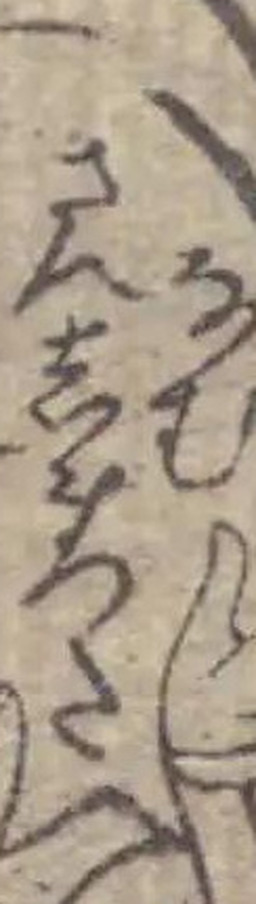さんしまつた
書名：朝比奈島渡 3巻
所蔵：国立国会図書館 National Diet Library, JAPAN
